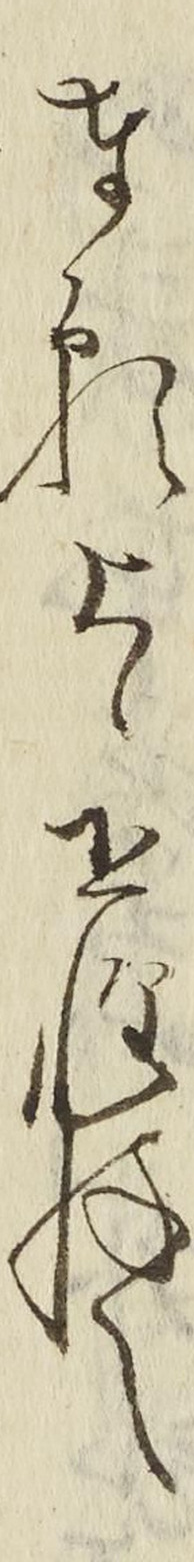奉願上候恐惶謹言
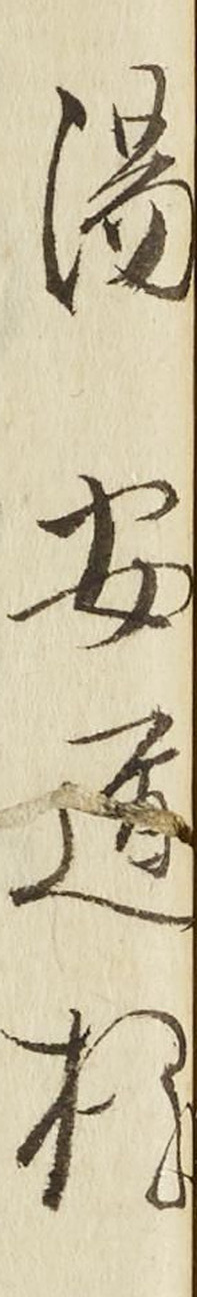湯安道様
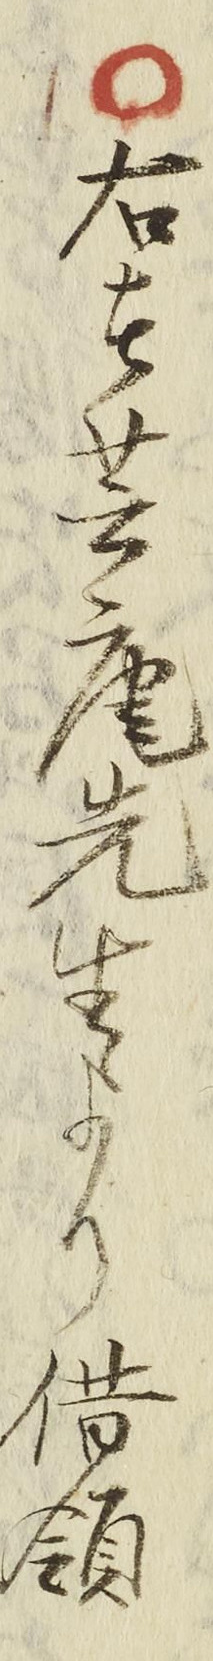○右は芸庵先生より借領

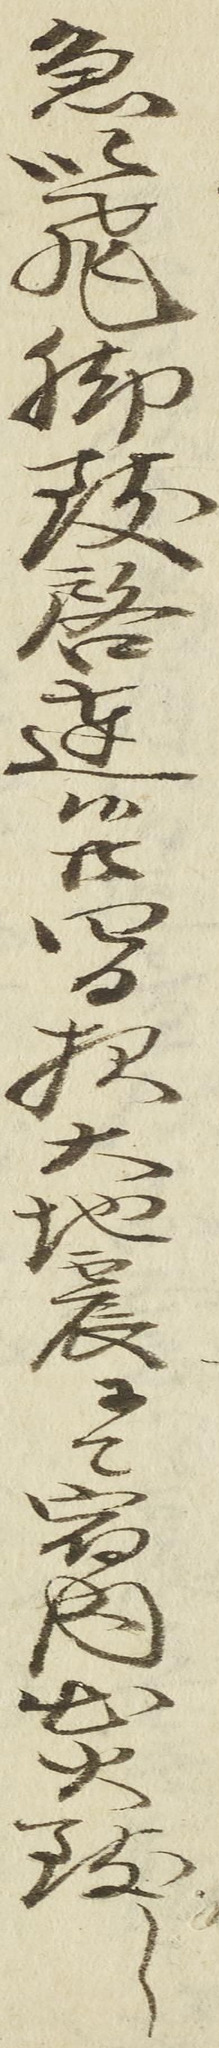急以飛脚致啓達候廿四日夜大地震二而宿内出火致し
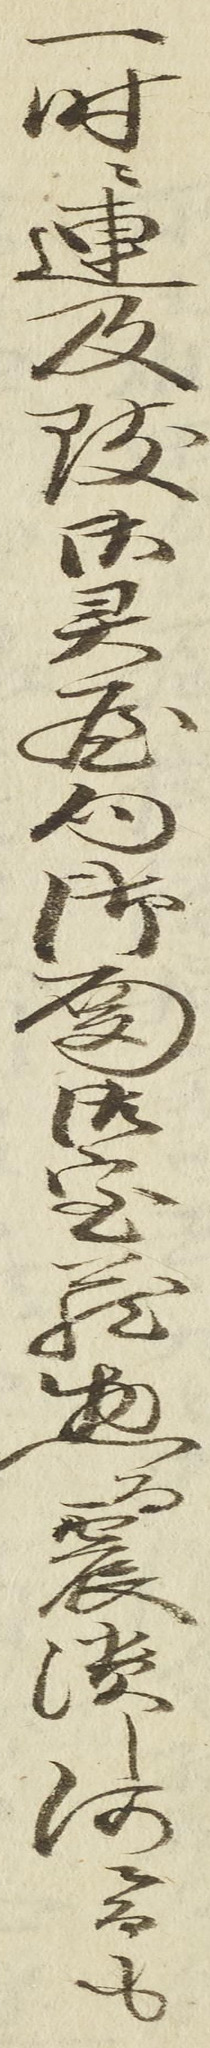一時二連火及致御㚑屋向御殿御宝蔵惣而動潰し何二而も
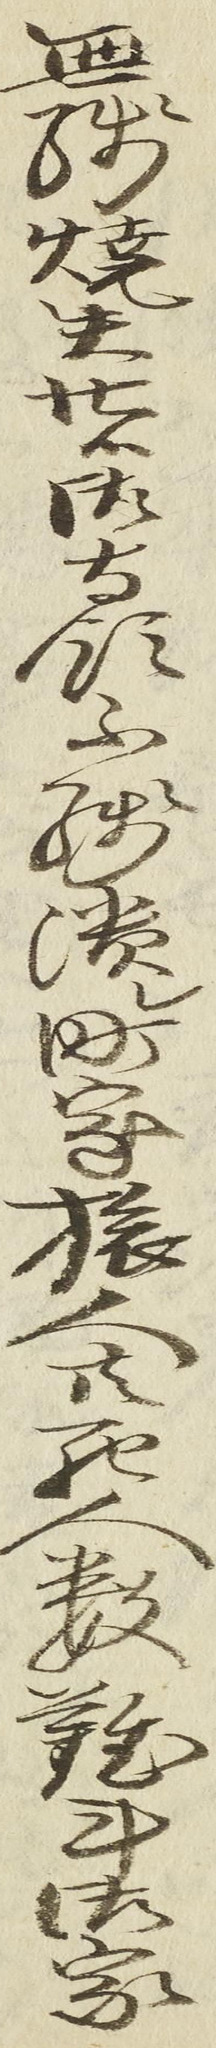無残焼失仕候御寺領不残潰ㇾ町家旅人共死人数難斗御家
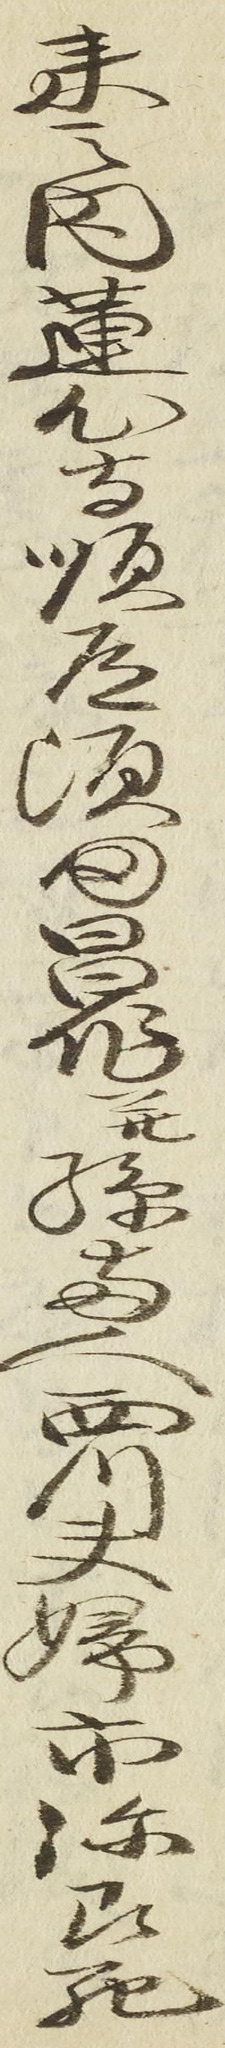來之内連心寺順道須田昌作并孫両人西川夫婦市弥即死
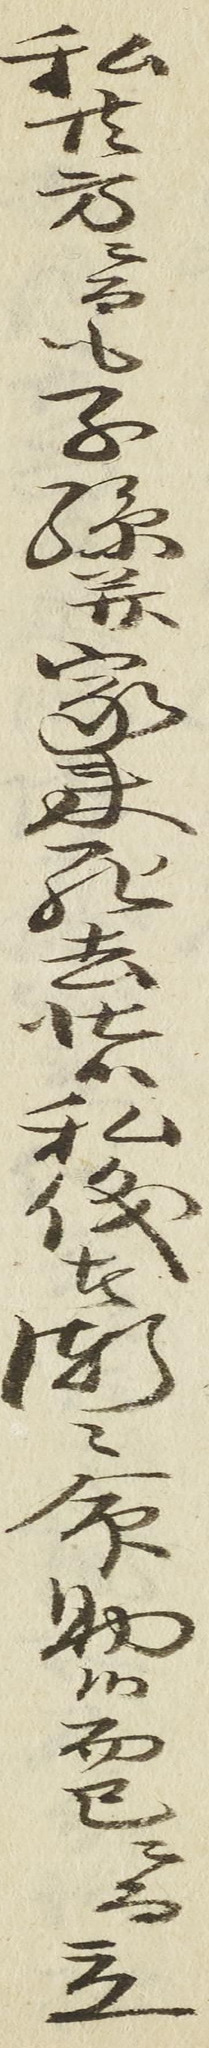私共方二而も子孫并家来死去仕候私儀は漸々命助候而巳二而立
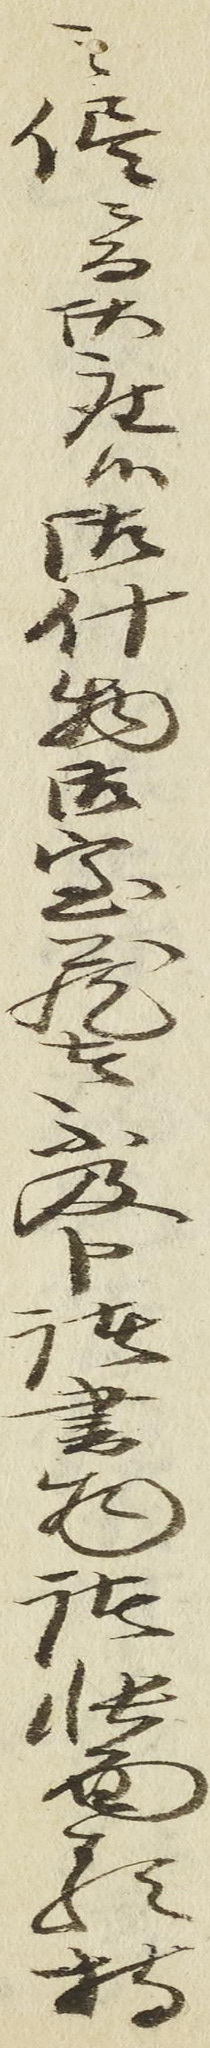候儘二而御座候御什物御宝蔵は不及申諸書物諸帳面類持
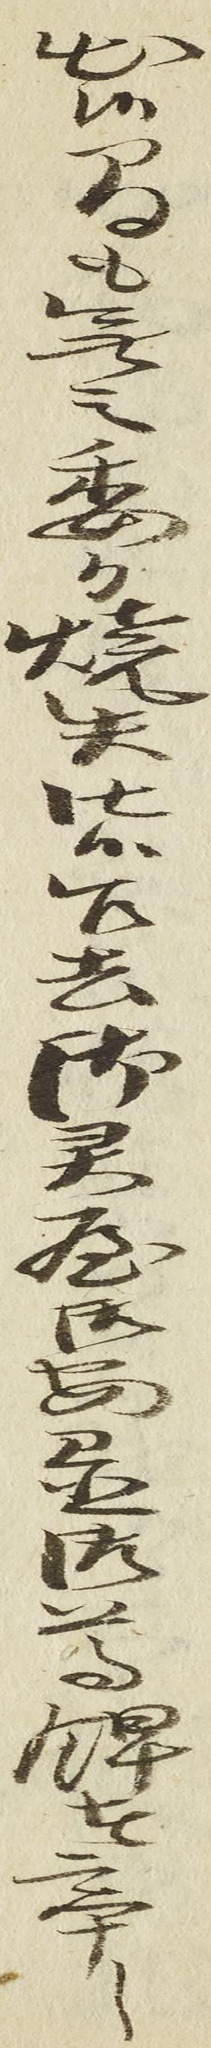出候間も無之悉く焼失仕候乍去御霊屋御安置御尊牌は辛し
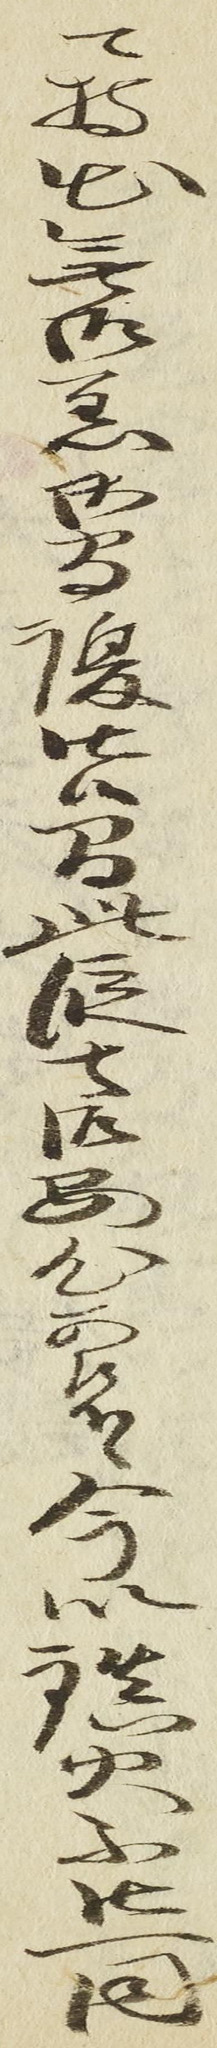て持出無御恙御守護仕候間此段は御安心可被下候今以鎮火不仕一同
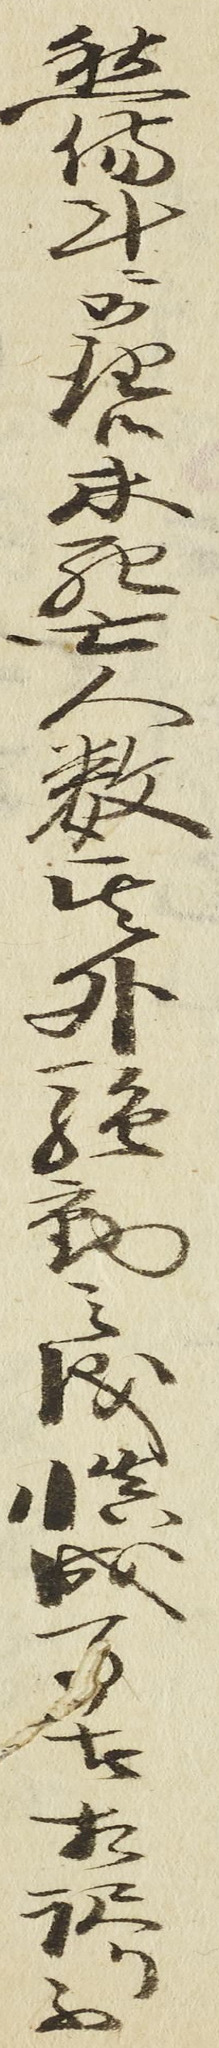愁傷斗二御座候未死亡人数其外騒動之儀慥成事は相訳り不
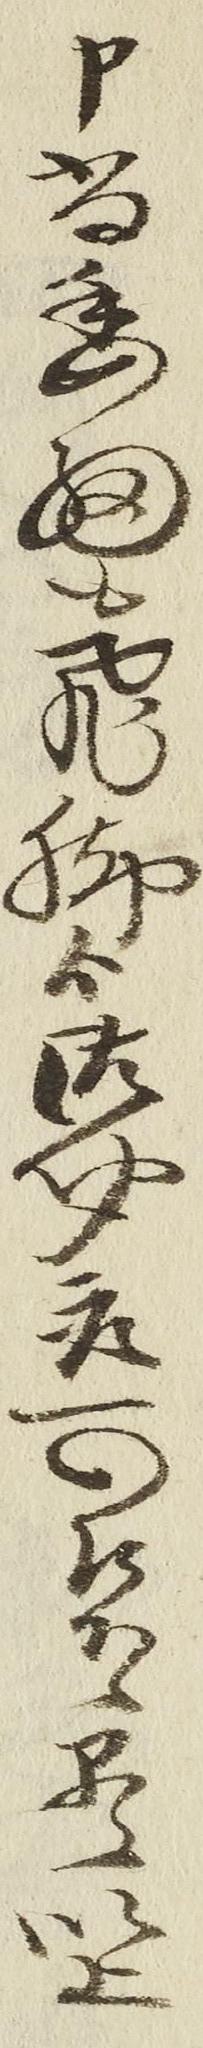申尚委細之は飛脚ゟ御聞取可被下候早々以上
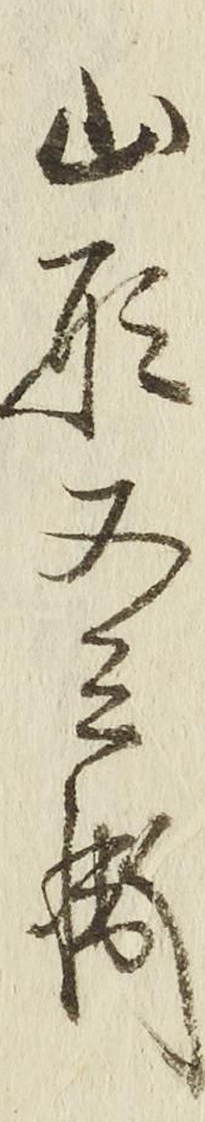山形又兵衛
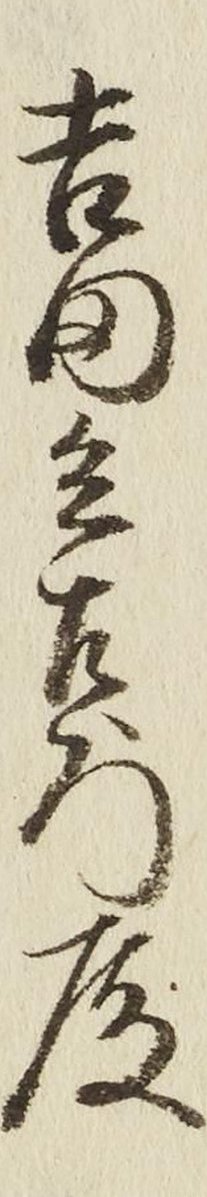吉田兵左衛門殿
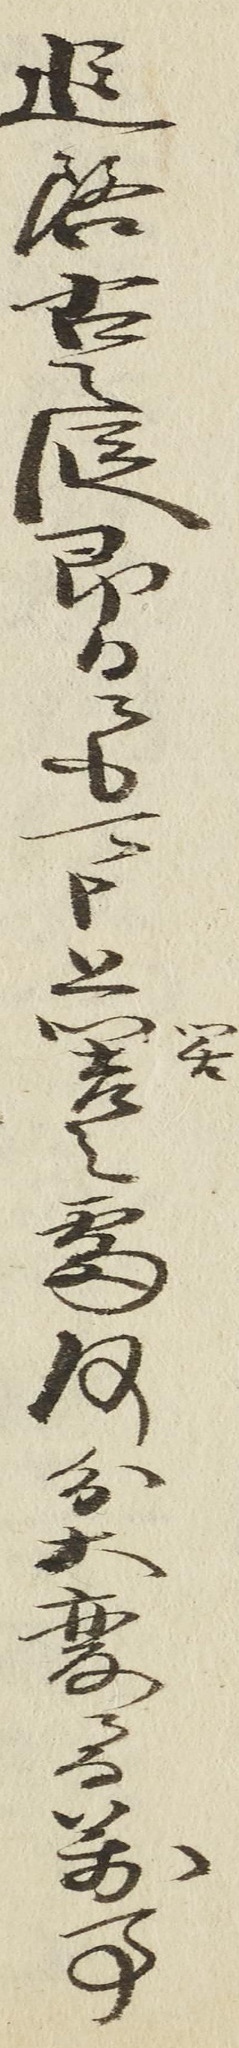追啓右之段即日にも可申上筈之処何分大変二而万事
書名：信濃國大地震記　乾
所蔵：東京大学地震研究所図書室 Earthquake Research Institute Library, The University of Tokyo, JAPAN
